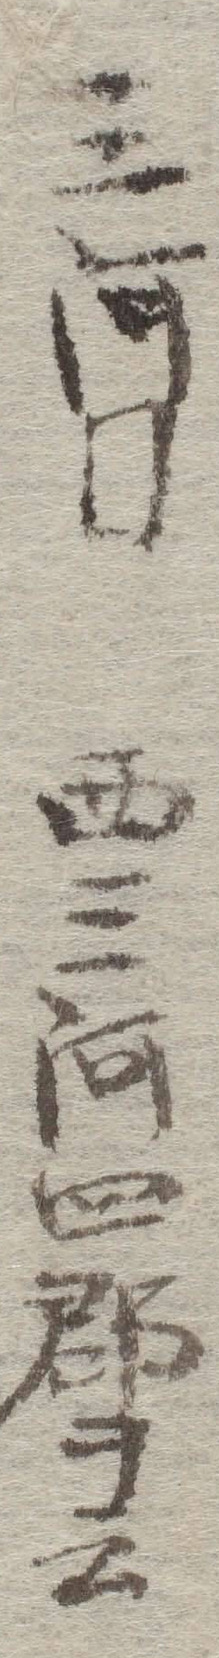三河国西三河四郡ヲ云

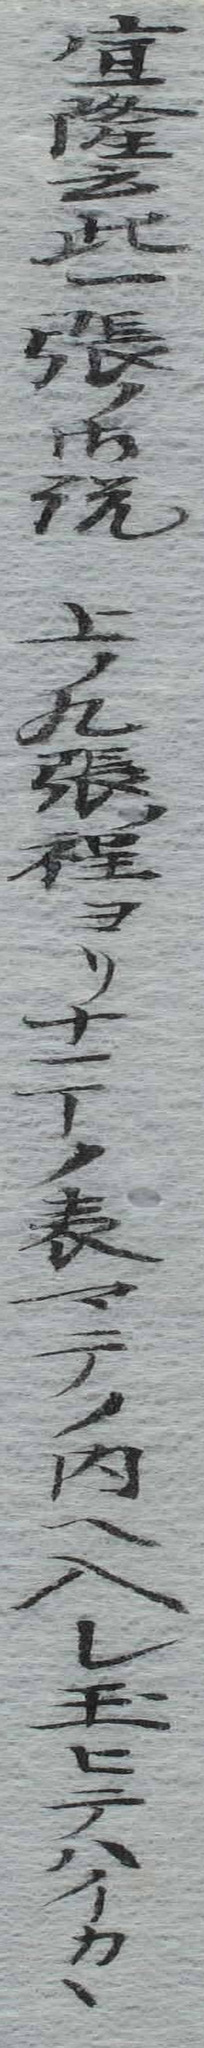宣隆云此一張ノ御説上ノ九張程ヨリ十一丁ノ表マテノ内ヘ入レ玉ヒテハイカヽ

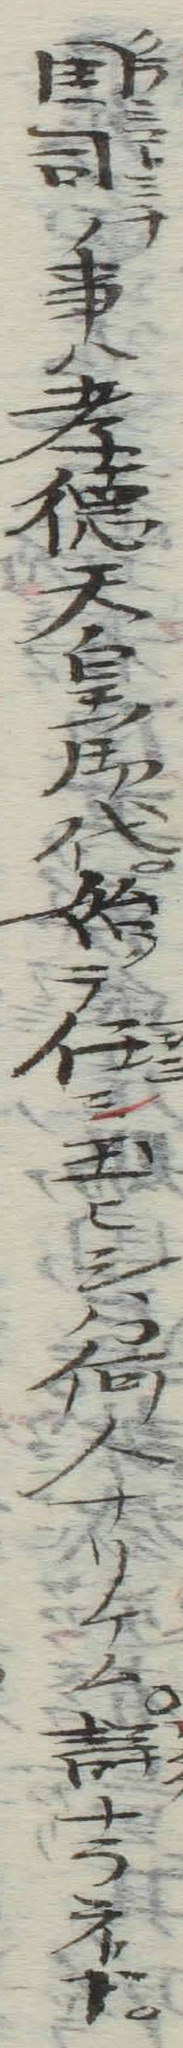国司ノ事ハ孝徳天皇御代。始リテ任シ玉ヒシハ。何人ナリケム。詳ナラネド。
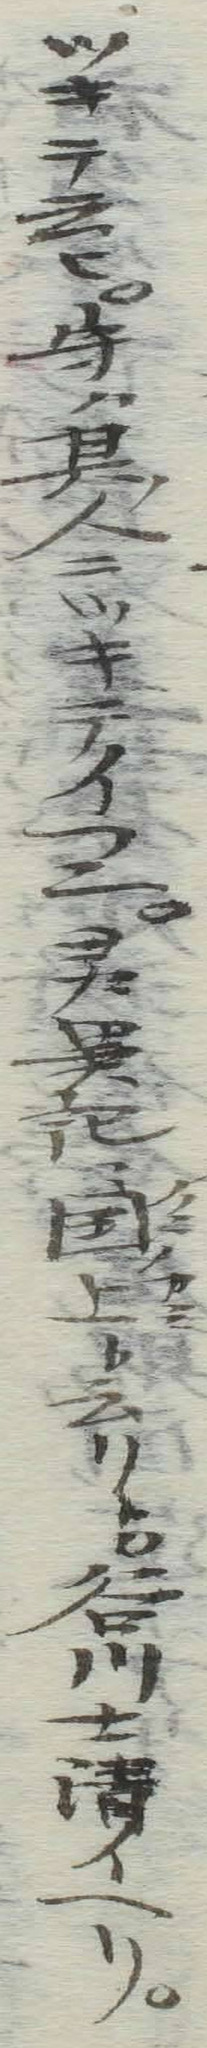ツキテ云ヒ。守ハ其人ニツキテノイフ也。霊異記国上ト云リト。谷川士清イヘリ。
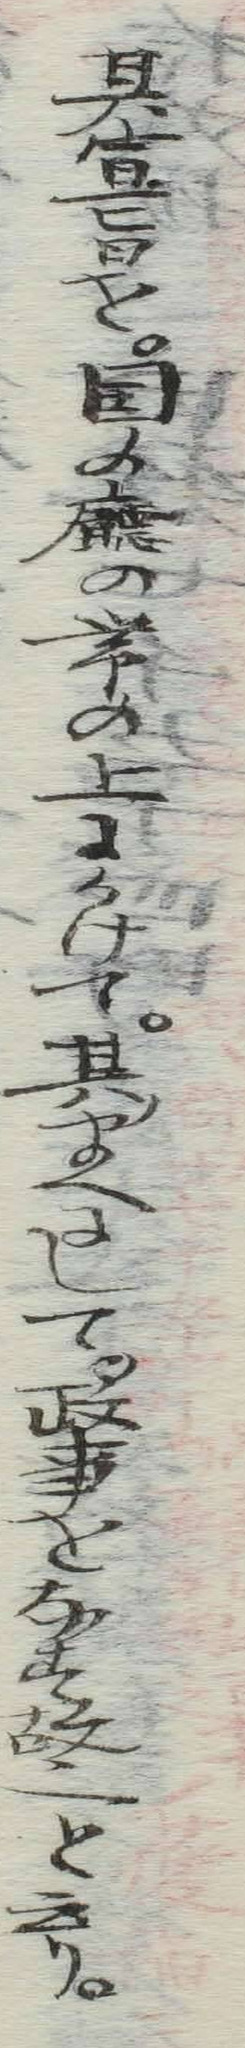其宣旨を。国の庁の常の上にかけて。其まへにして。政事をなす故也と云り。
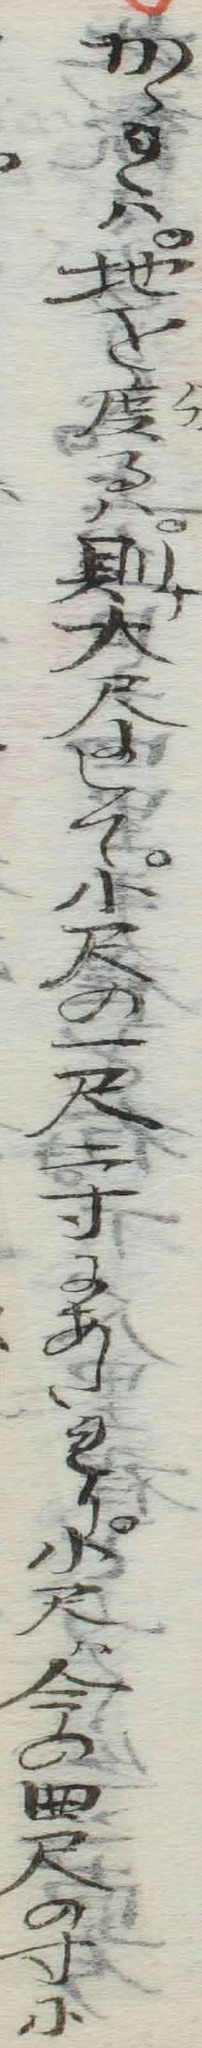◯かゝれハ。地を度るハ。則大尺にして。小尺の一尺二寸にあたれり。小さ尺今の曲尺の寸に
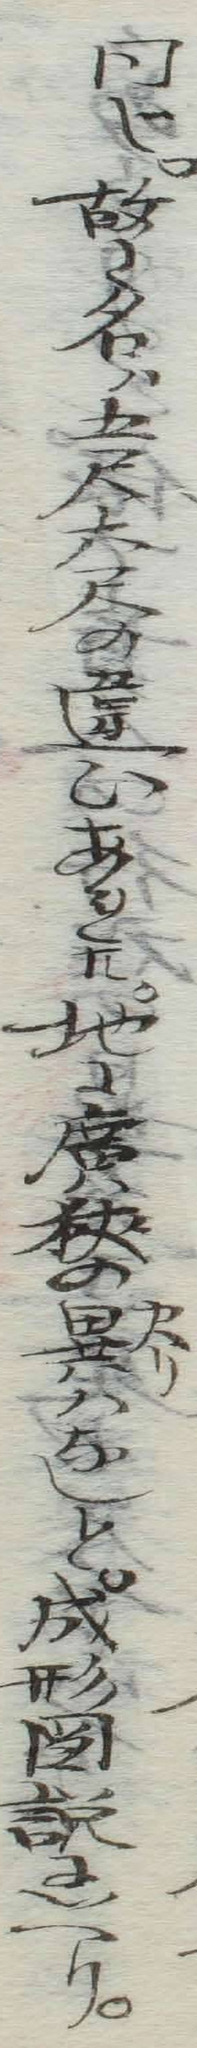同じ。故に名五尺六尺の違日あれ共。地に廣狭の異ハなしと。成形図説にいへり。
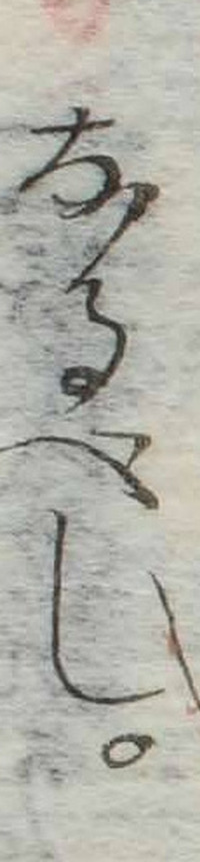なるべし。
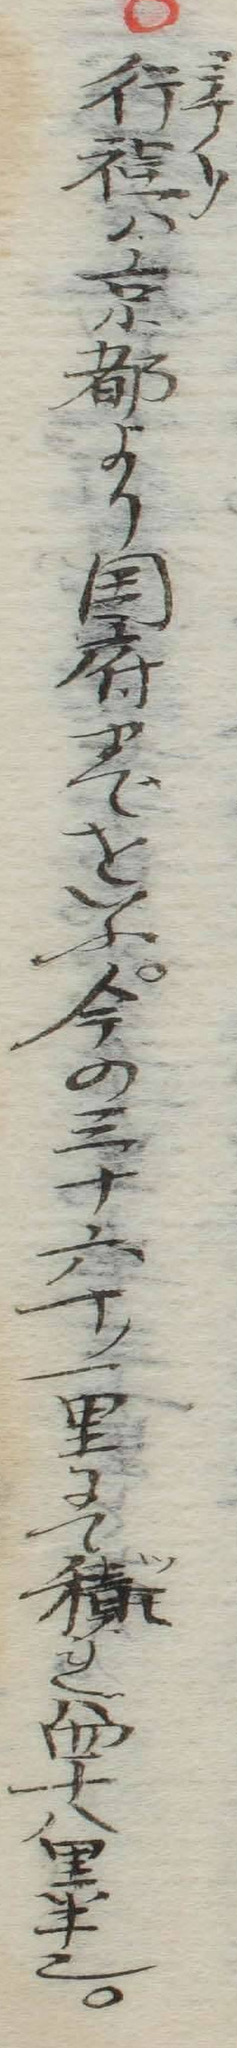◯行程ハ京都より国府までといふ。今の三十六丁一里にて積れハ四十六里半也。

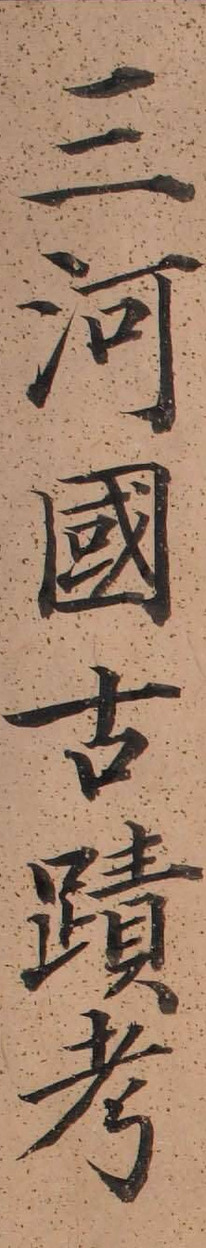三河国古蹟考上
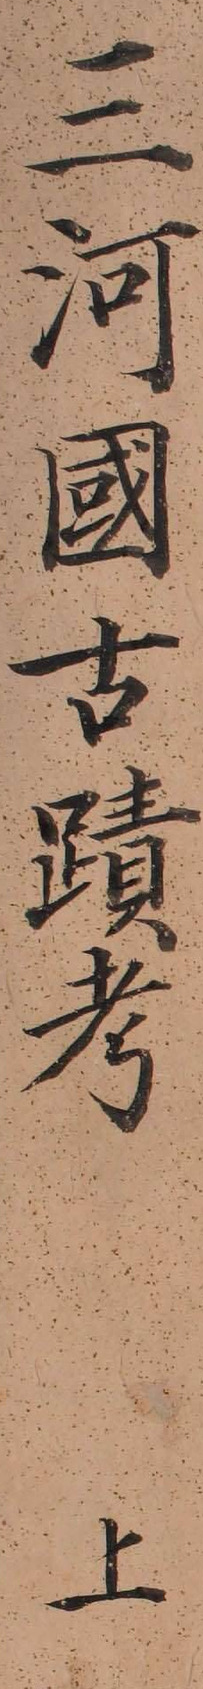三河国古蹟考上

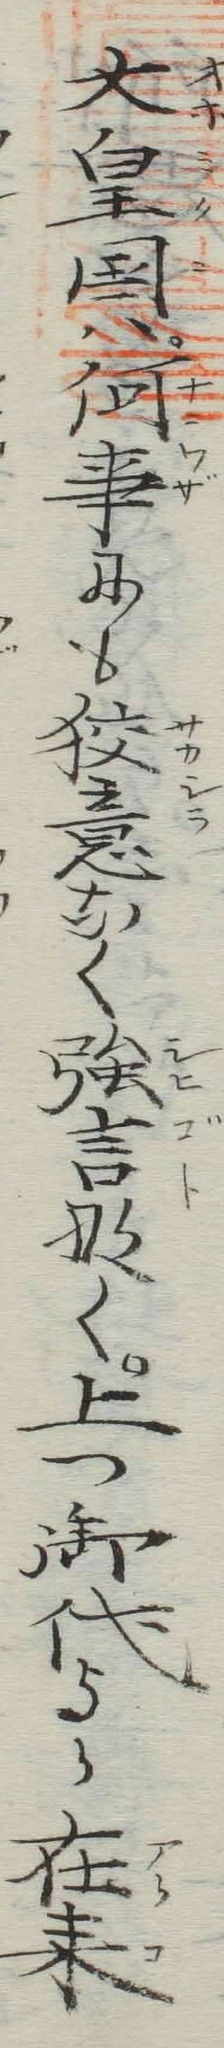大皇国は。何事にも狡意なく強言なく。上つ御世より在来
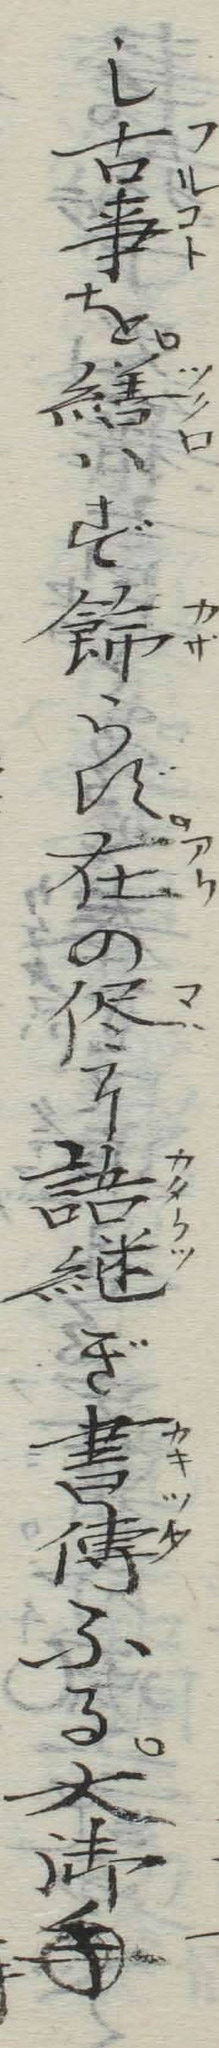し古事を。繕はず飾らず。在の侭に語継ぎ書伝ふる。大御手
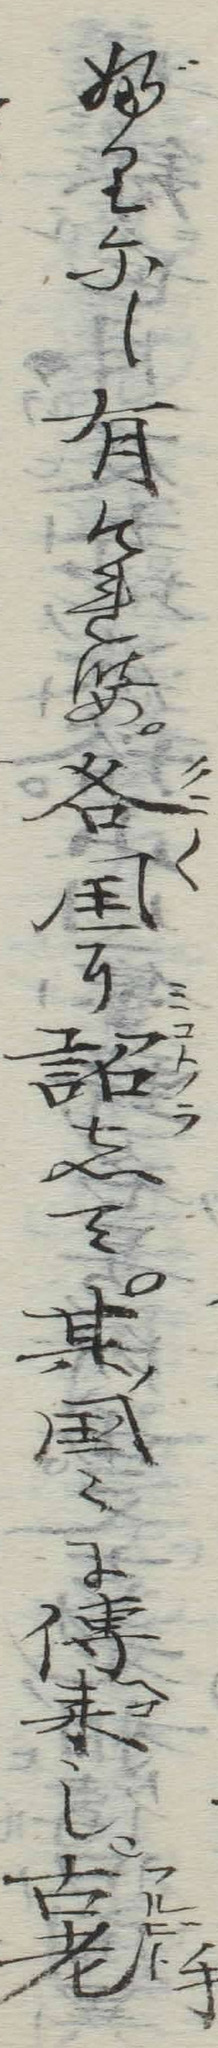ぶりにし有ければ。各国に詔して。其国々に伝来し。古老
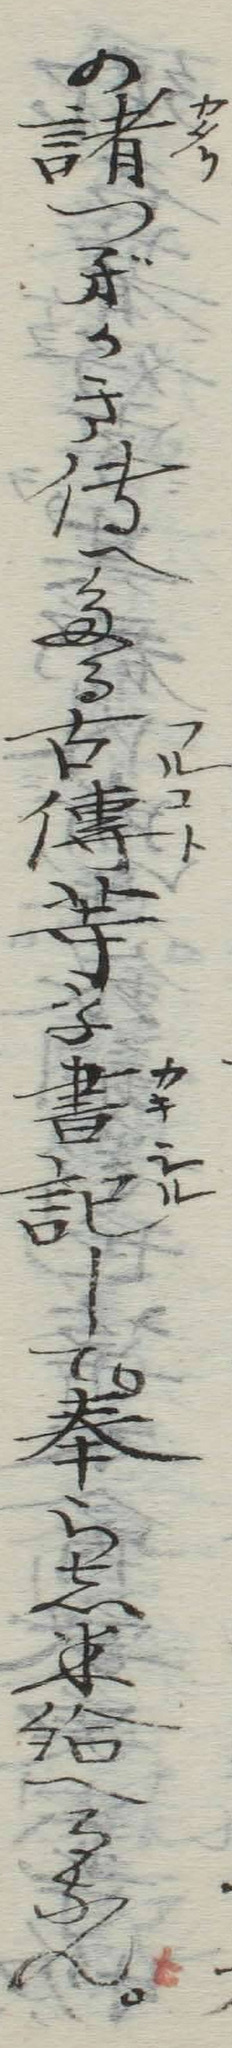の諸つぎかき伝へたる古伝等を書記して。奉らしめ給へるなん。
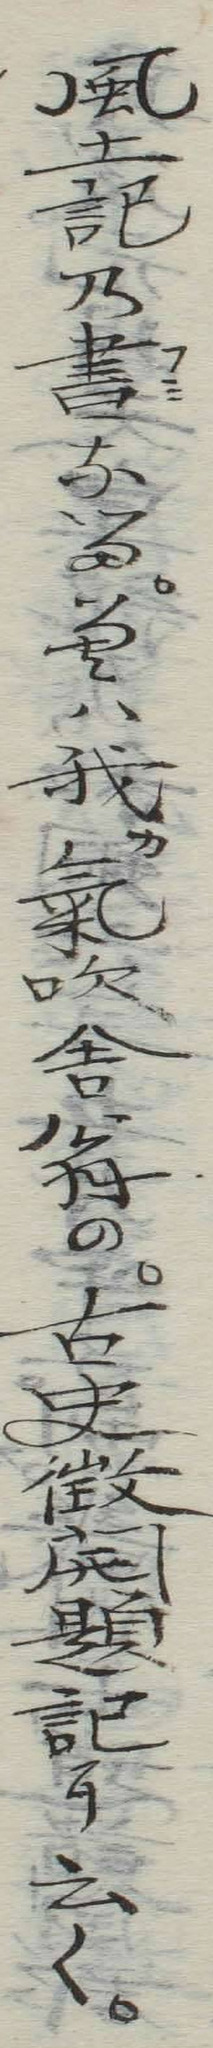風土記の書なる。そは我気吹舎翁の。古史徴開題記に云く。
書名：三河国古跡考
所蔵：国文学研究資料館
